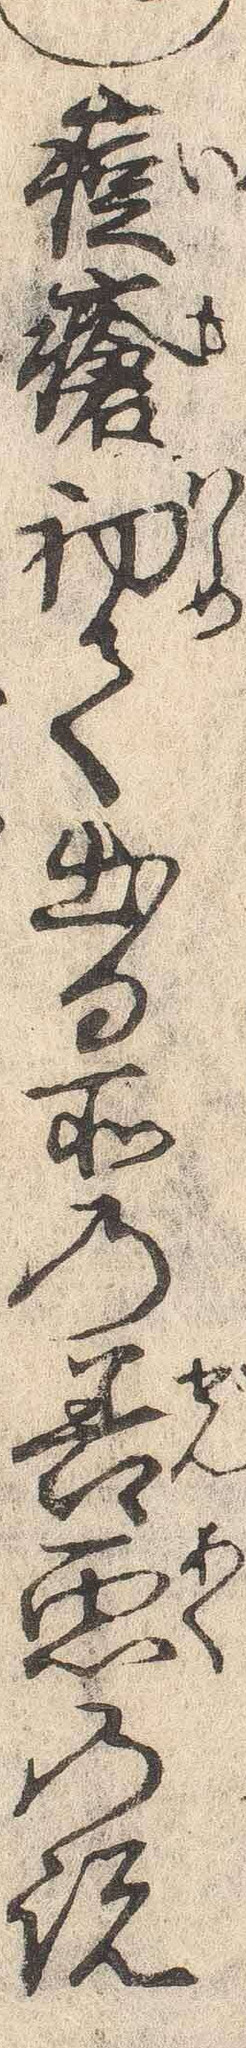㊈痘瘡初て出る所の善悪の説
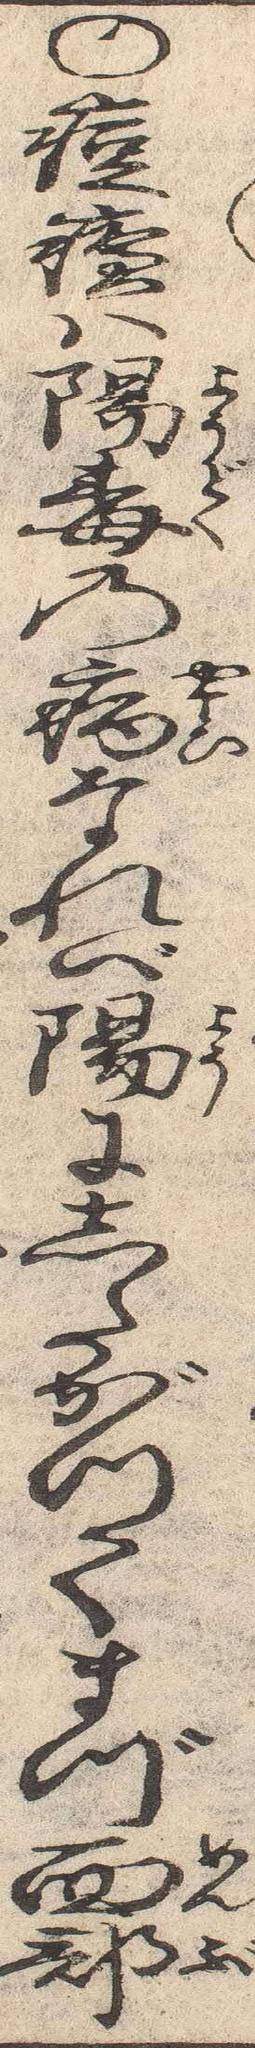○痘瘡は陽毒の病なれば陽にしたがつてまづ面部
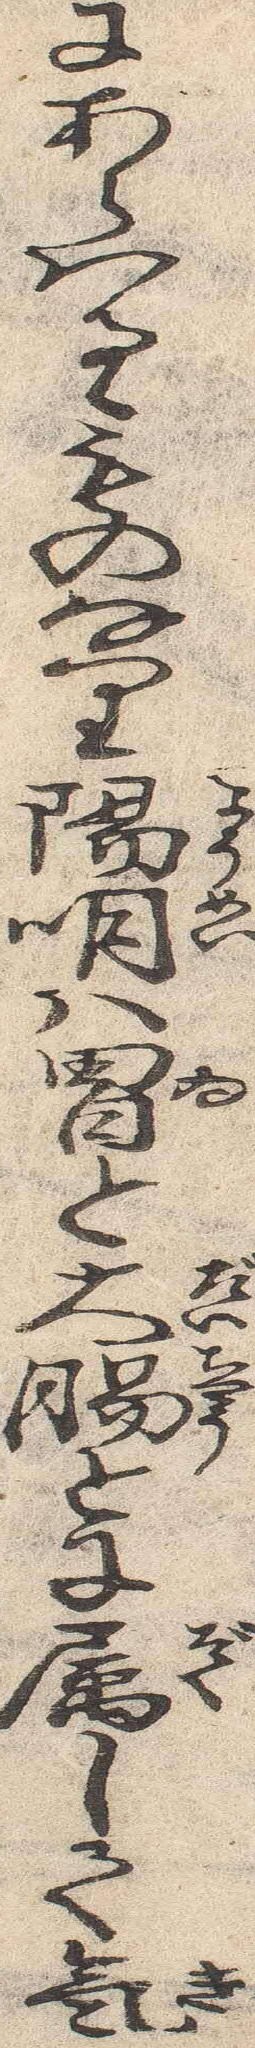にあらはるゝものなり陽明は胃と大腸とに属して気
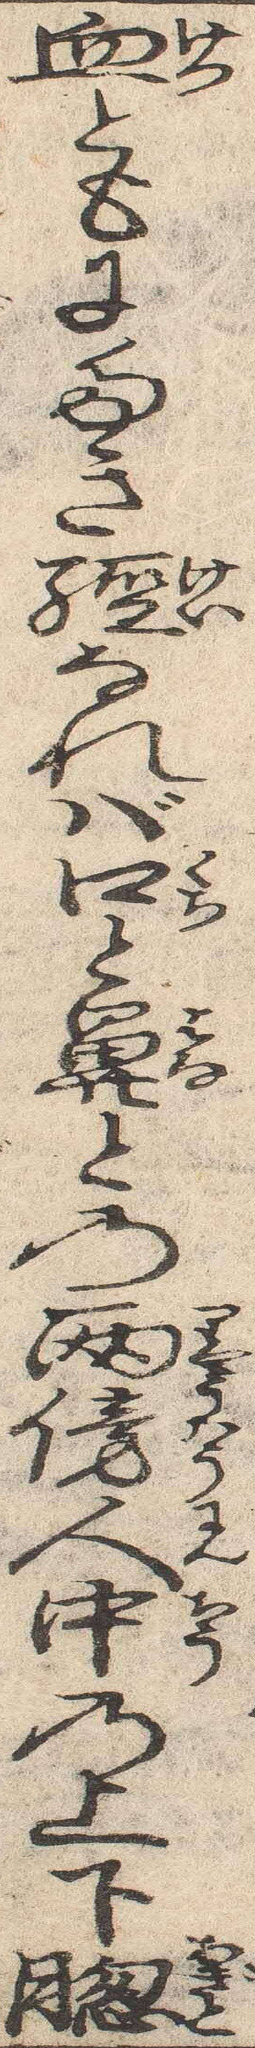血ともに多き経なれば口と鼻との両傍人中の上下顋
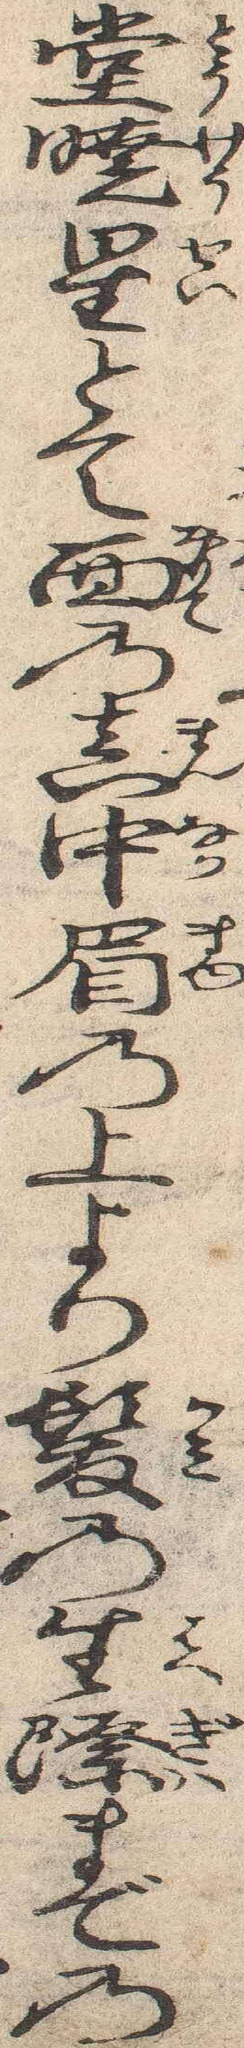堂暁星とて面の真中眉の上より髪の生際までの
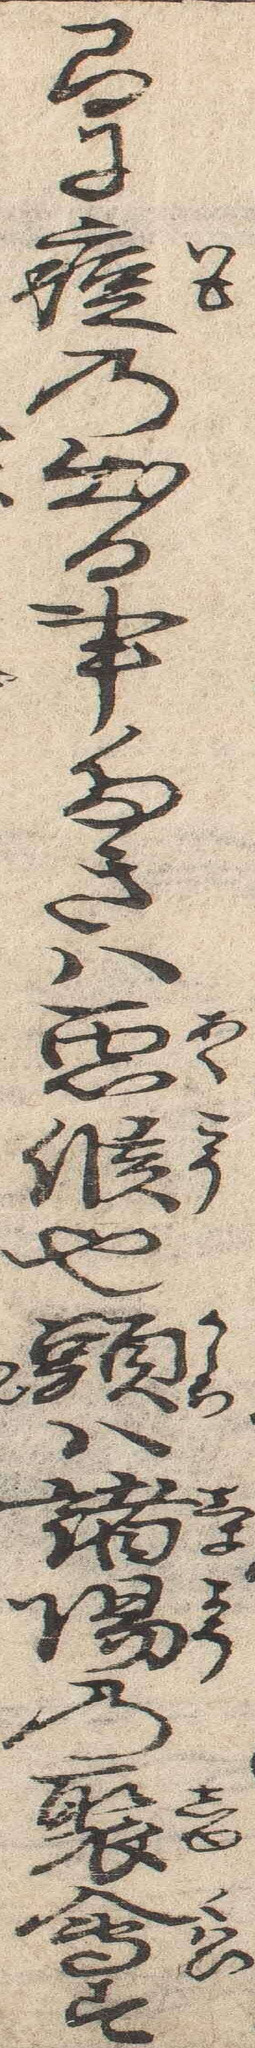間に痘の出る事多きは悪候也頭は諸陽の聚会す

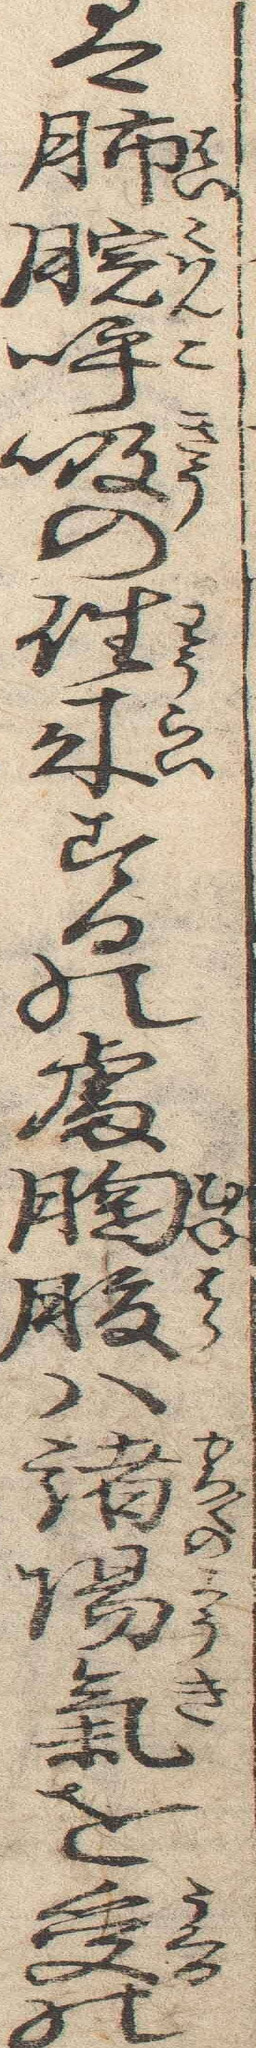は肺脘呼吸の往来するの処胸腹は諸陽気を受の
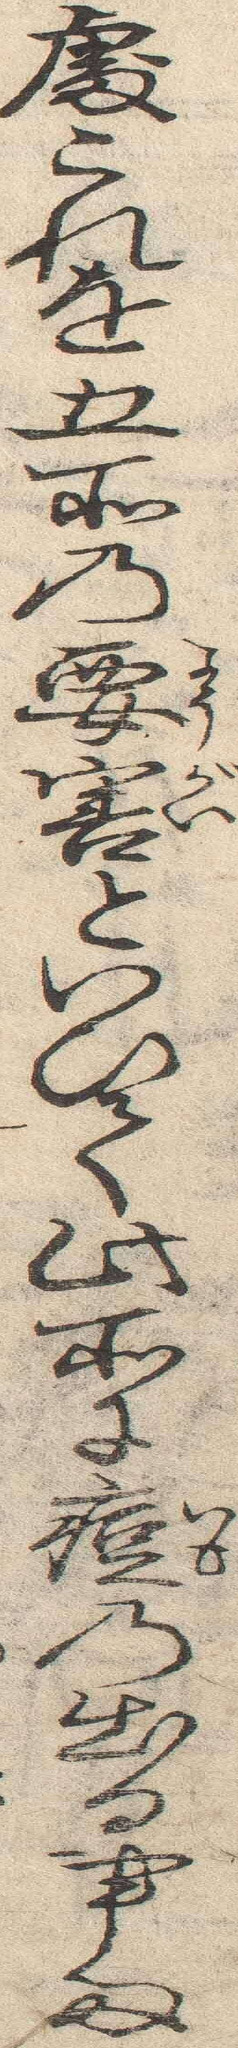処これを五所の要害といひて此所に痘の出る事多
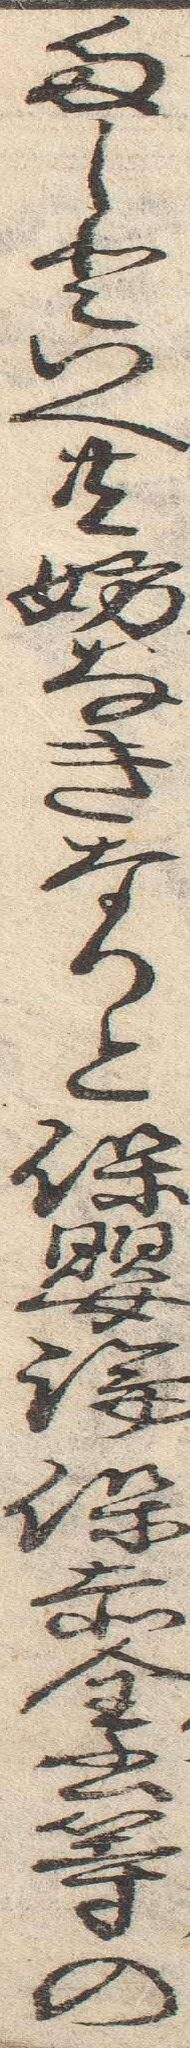多しといへ共妨なきなりと保嬰論保赤全書等の
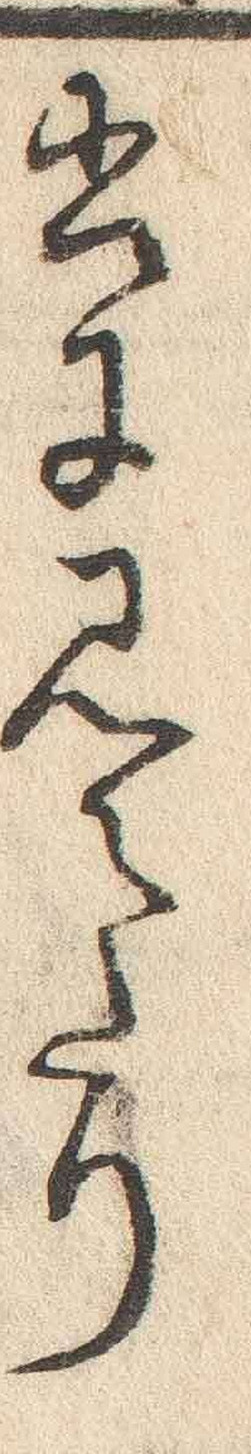書に見えたり
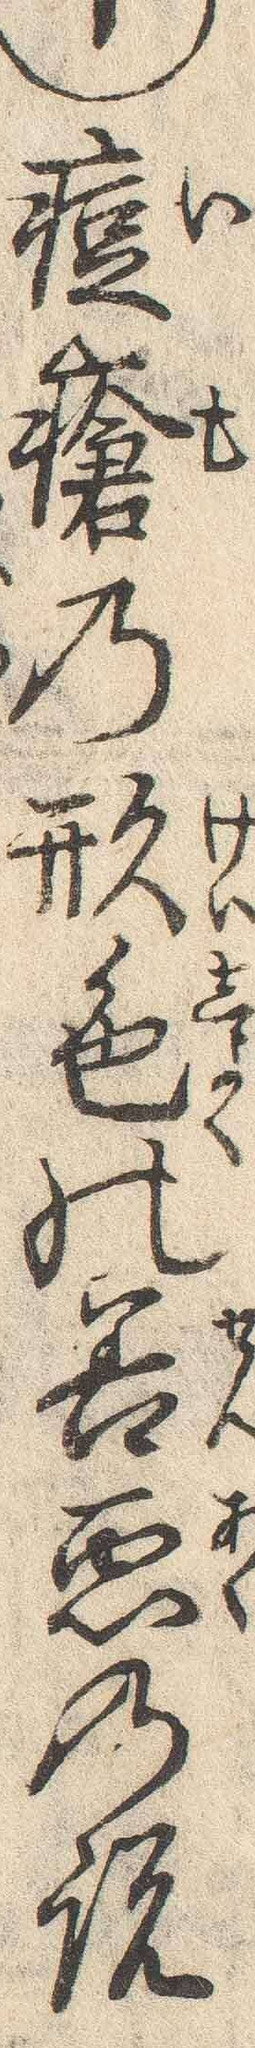㊉痘瘡の形色の善悪の説
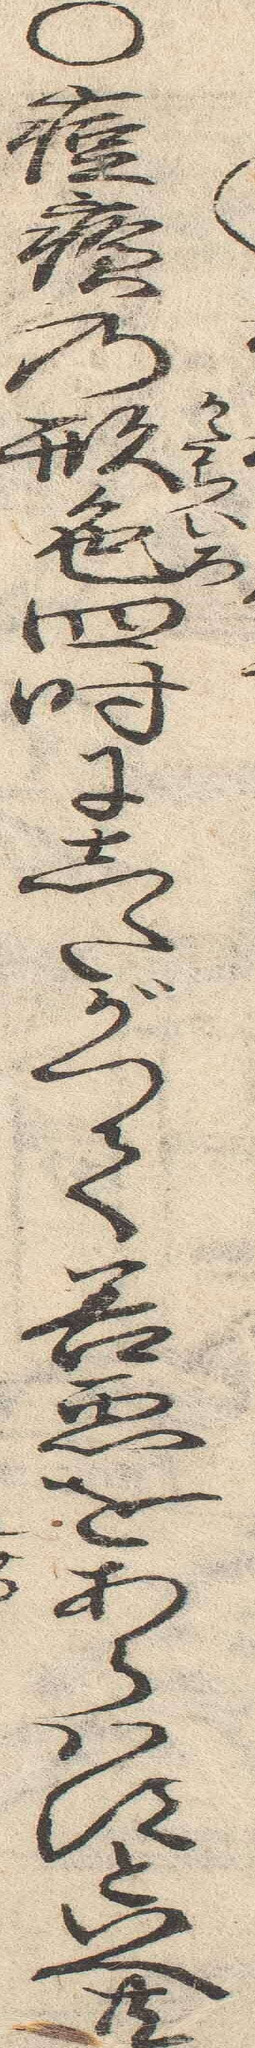○痘瘡の形色四時にしたがつて善悪をあらはすといへ共
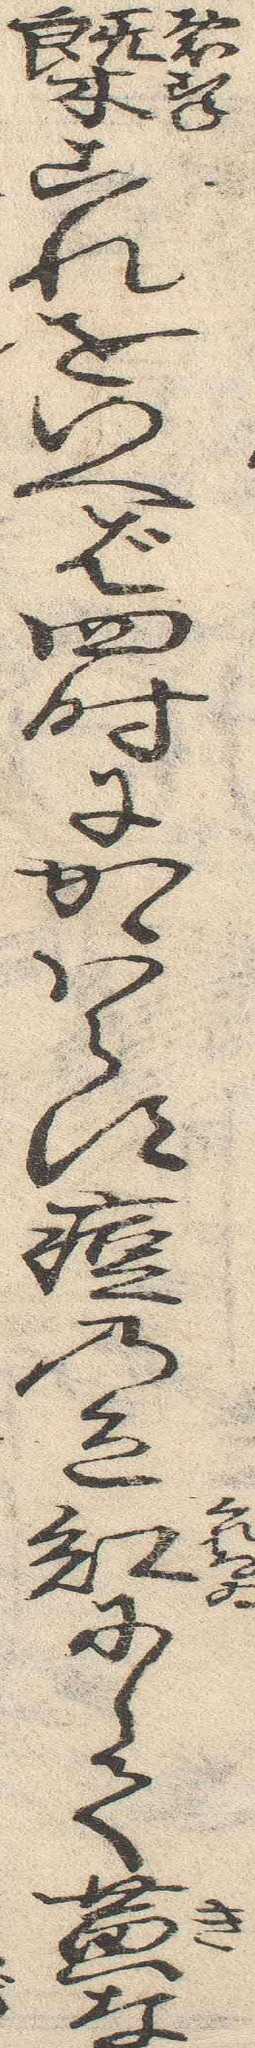概これをいへば四時にかゝはらす痘の色紅にして黄な
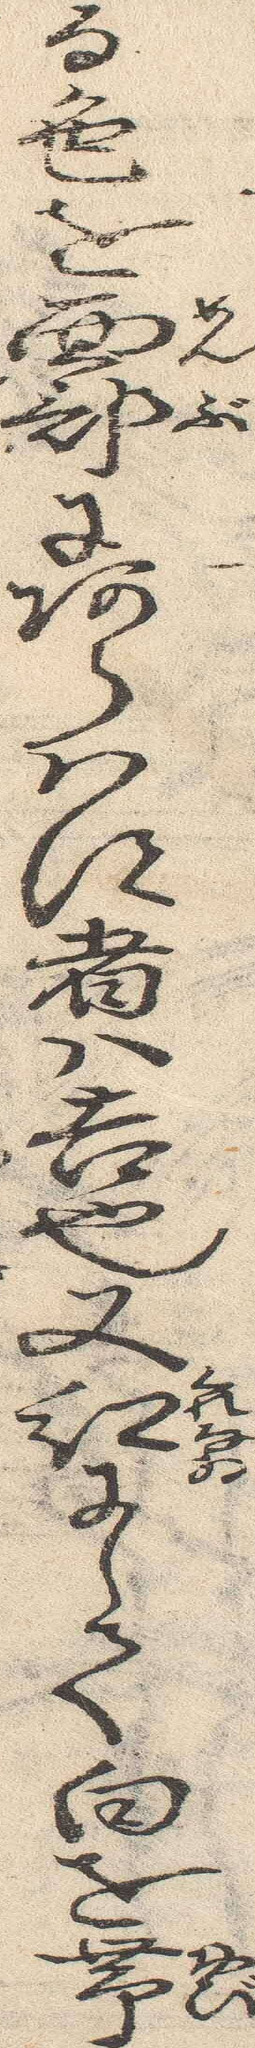る色を面部にあらはす者は吉也又紅にして白を帯
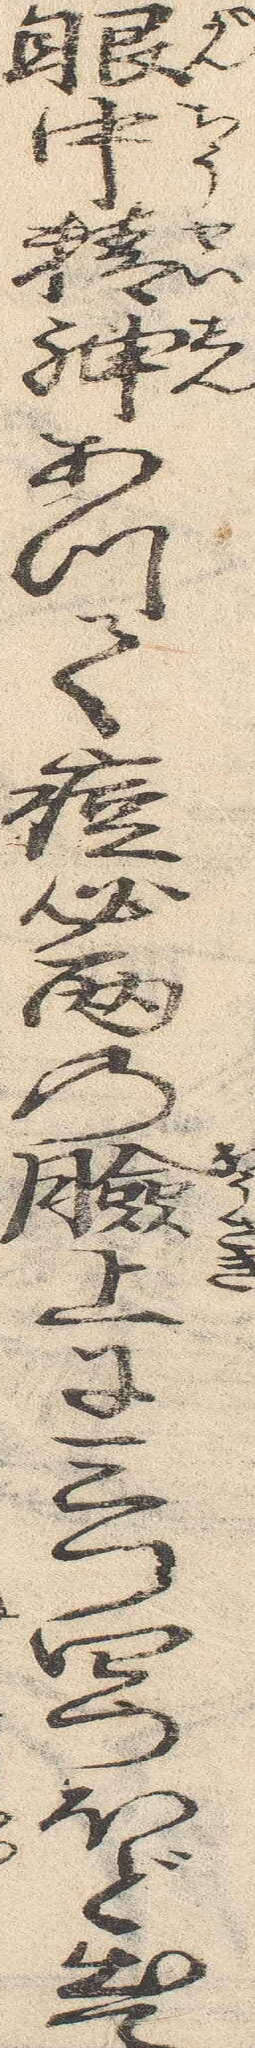眼中精神あつて症必両の臉上に三つ四つほど出て
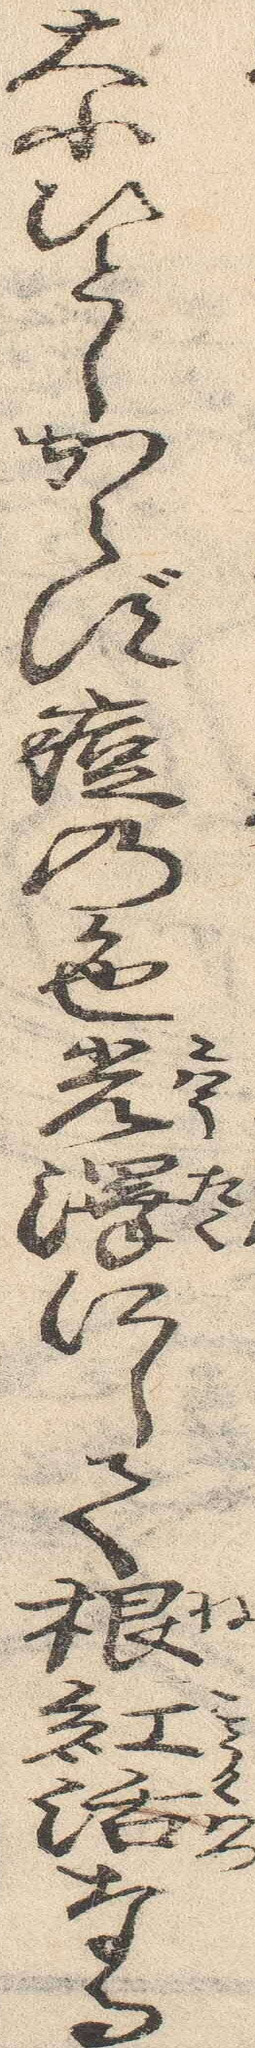大小ひとしからず痘の色光沢にして根紅活なる
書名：小児必用養育草
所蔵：東京学芸大学附属図書館 国文学研究資料館
